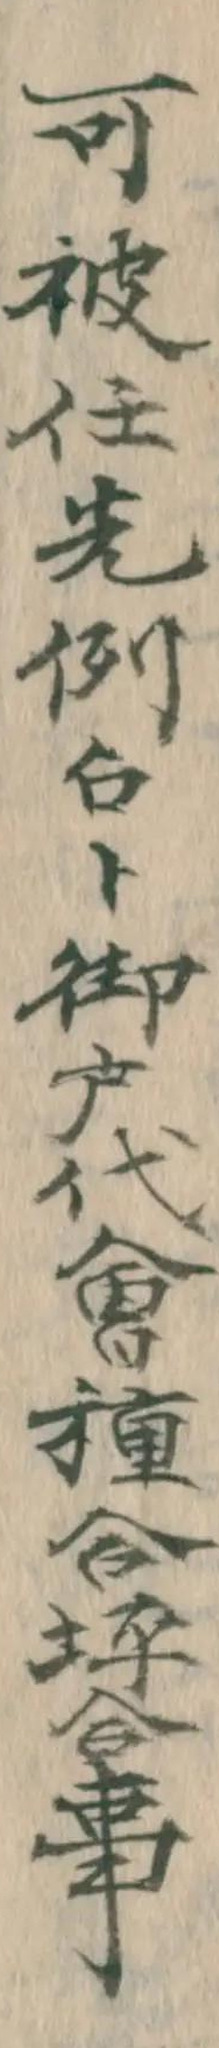可被任先例占卜御戸代会種合坪合事
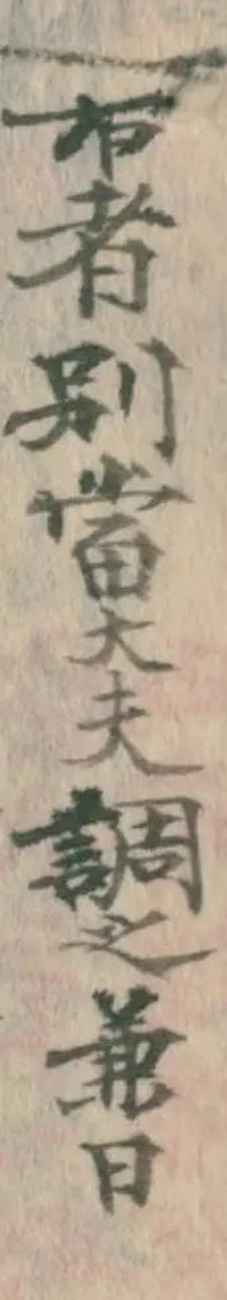右者別当大夫調之兼日
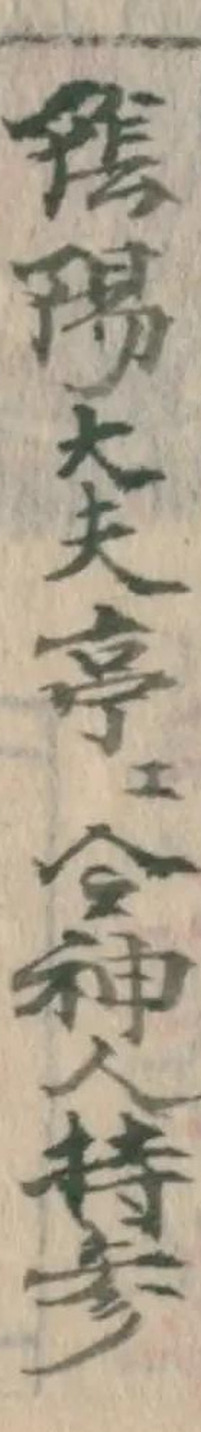陰陽大夫亭エ令神人持参
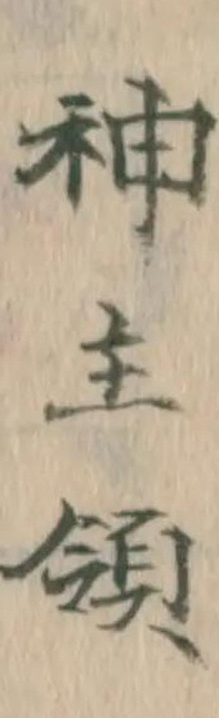神主領
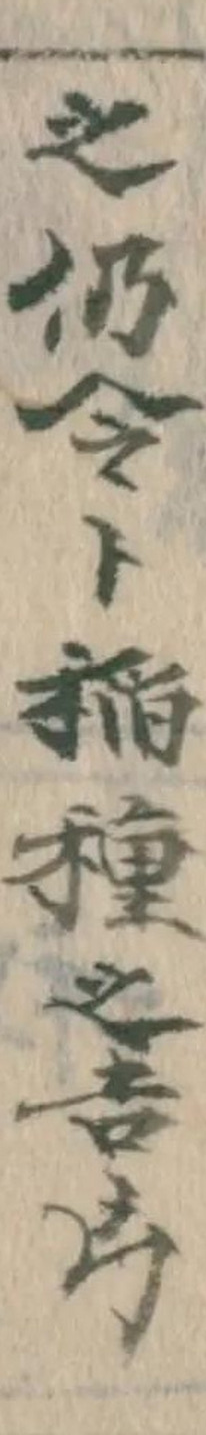之仍令卜稲種之吉弓
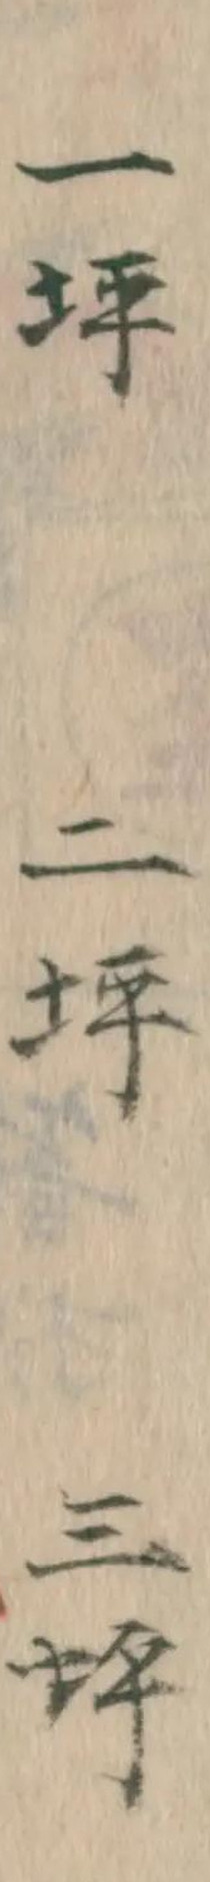一坪二坪三坪
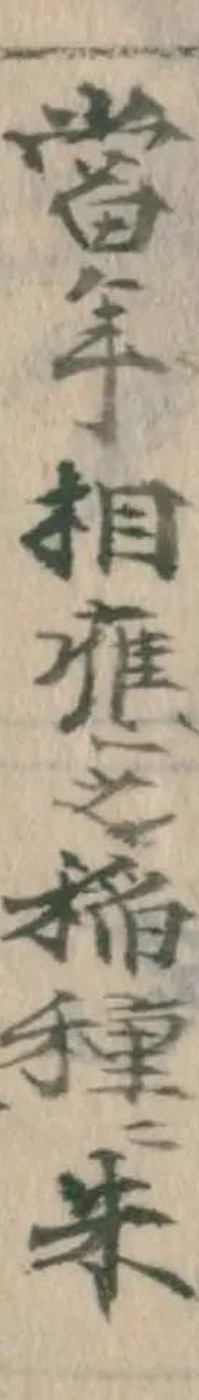当年相応之稲種ニ朱
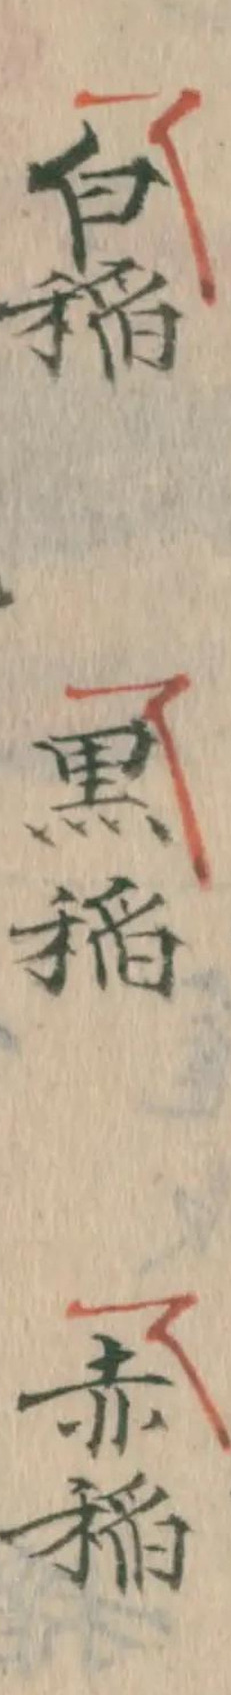白稲黒稲赤稲
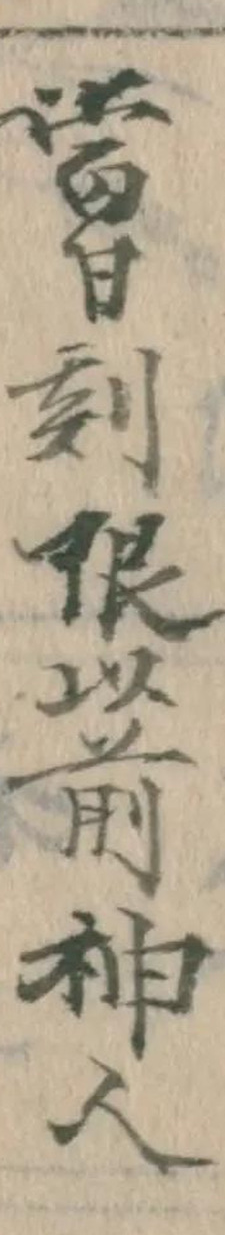当日刻限以前神人
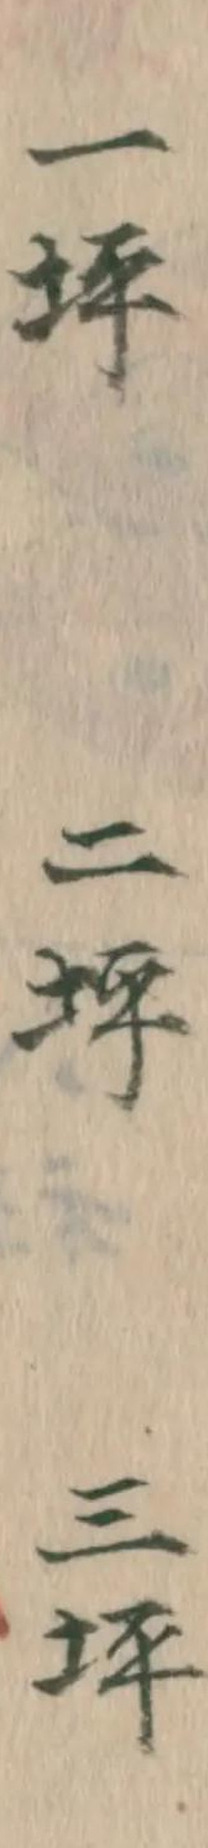一坪二坪三坪
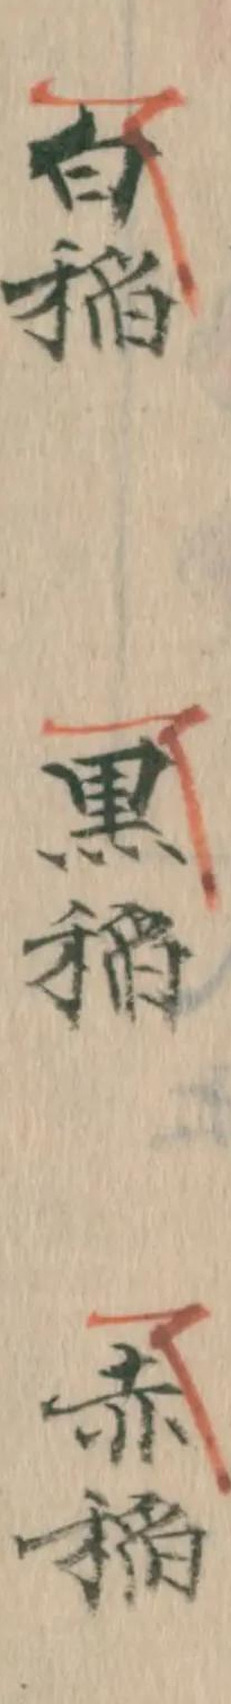白稲黒稲赤稲
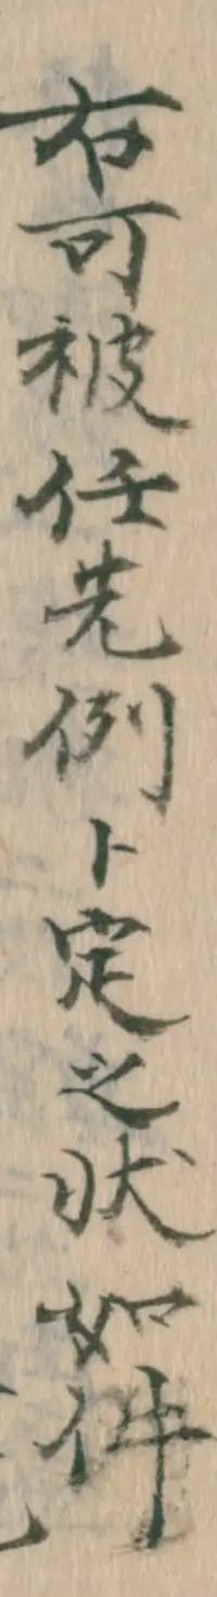右可被任先例卜定之状如件
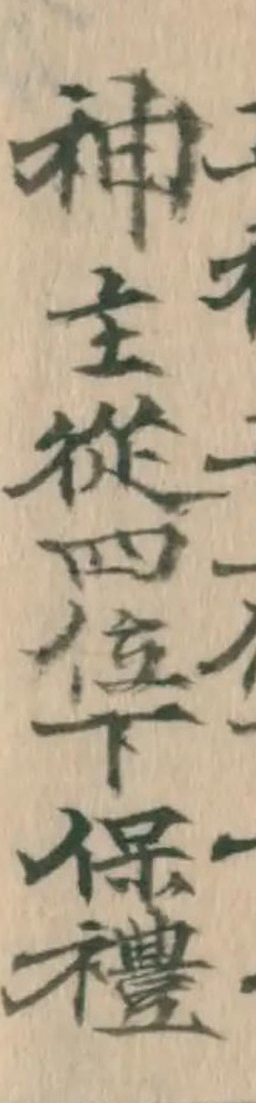神主従四位下保礼
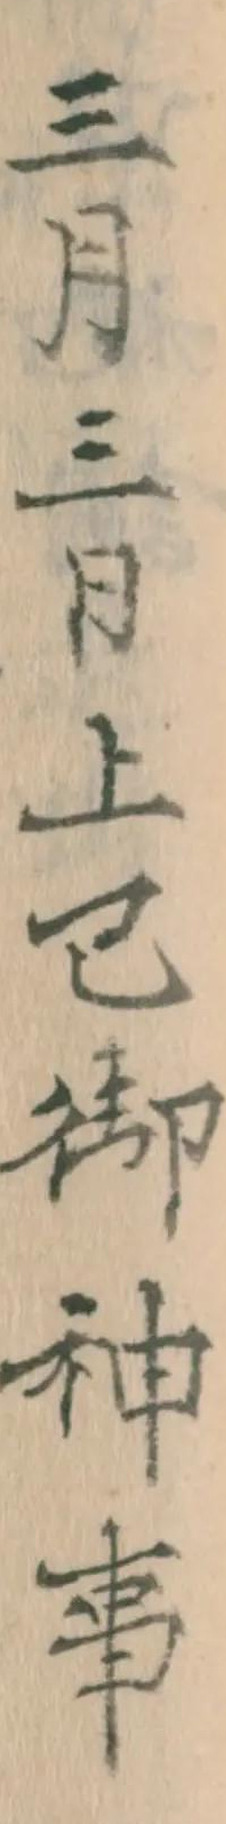三月三日上巳御神事
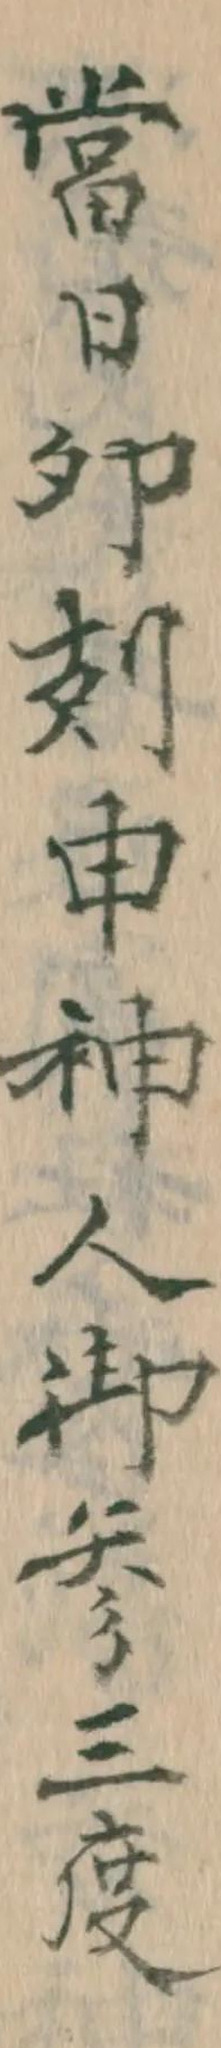当日卯刻申神人御参三度
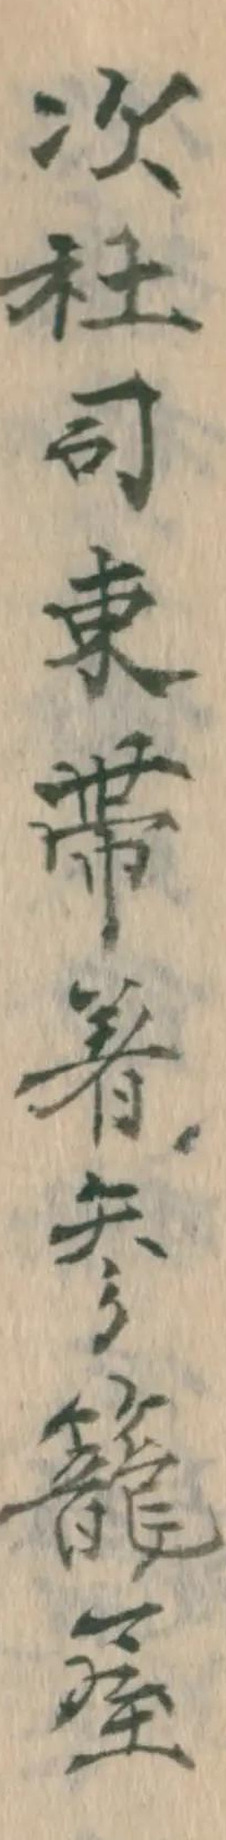次社司束帯着参籠屋
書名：賀茂社記録. 第9冊
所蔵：国立国会図書館 National Diet Library, JAPAN
